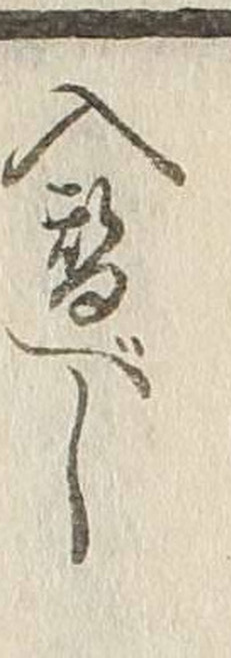入替べし
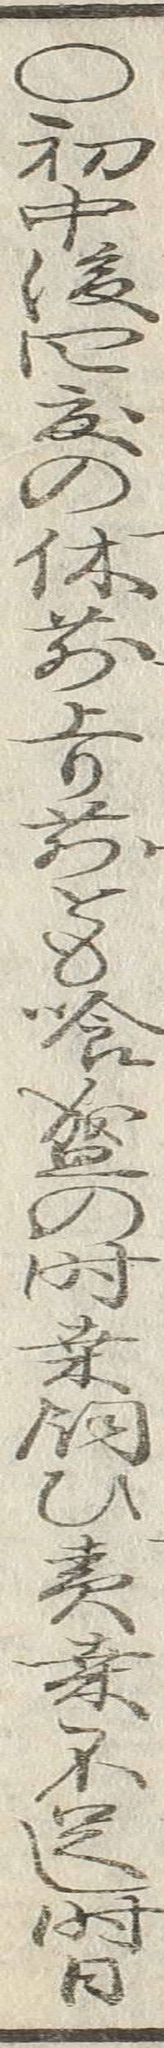○初中後四度の休前上り前とも喰盛の時桑飼ひ責桑不足し時日
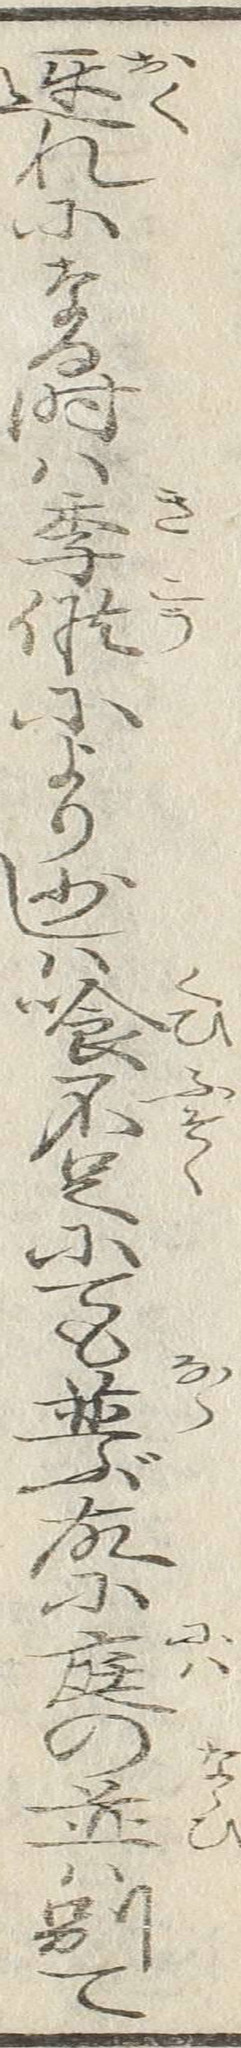遅れになる時は季候により少しは喰不足にても並ぶ故に庭の並は別て
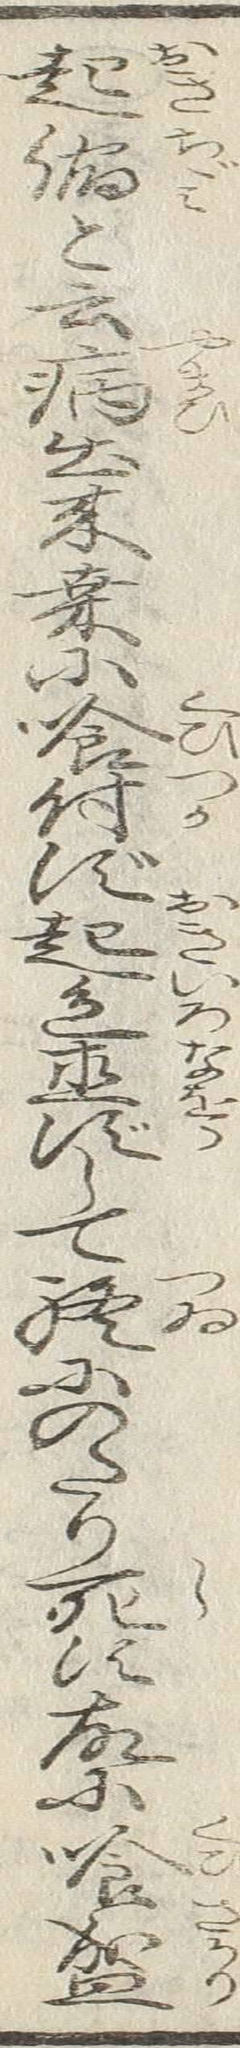起縮と云病出来桑に喰付ず起色直ずして終にのたり死す故に喰盛
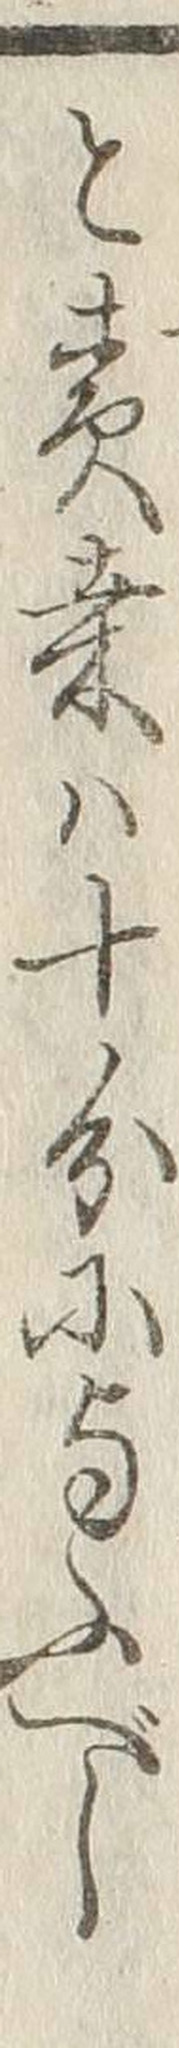と責桑は十分に与ふべし
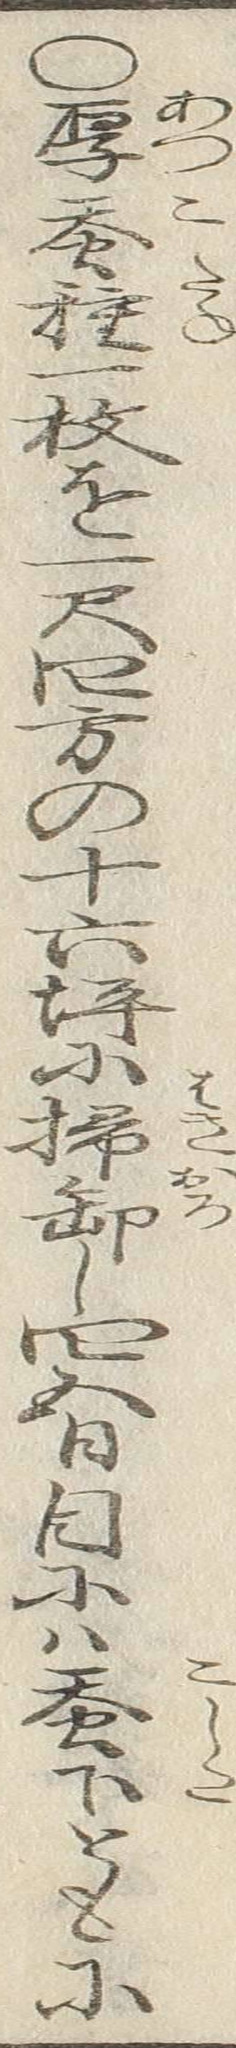○厚蚕種一枚を一尺四方の十六坪に掃卸し四五日目には蚕下ともに
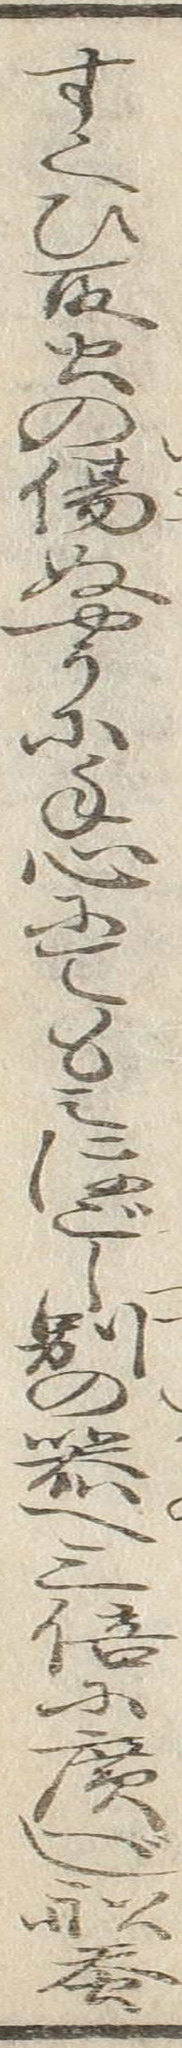すくひ取虫の傷ぬやうに手心にてもみほごし別の器へ三倍に廣べし舩蚕

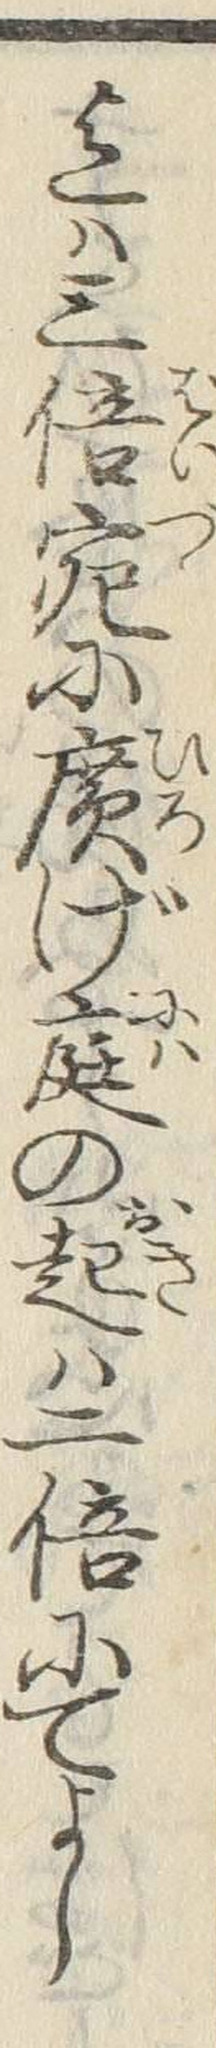迄は三倍宛に廣げ庭の起は二倍にてよし
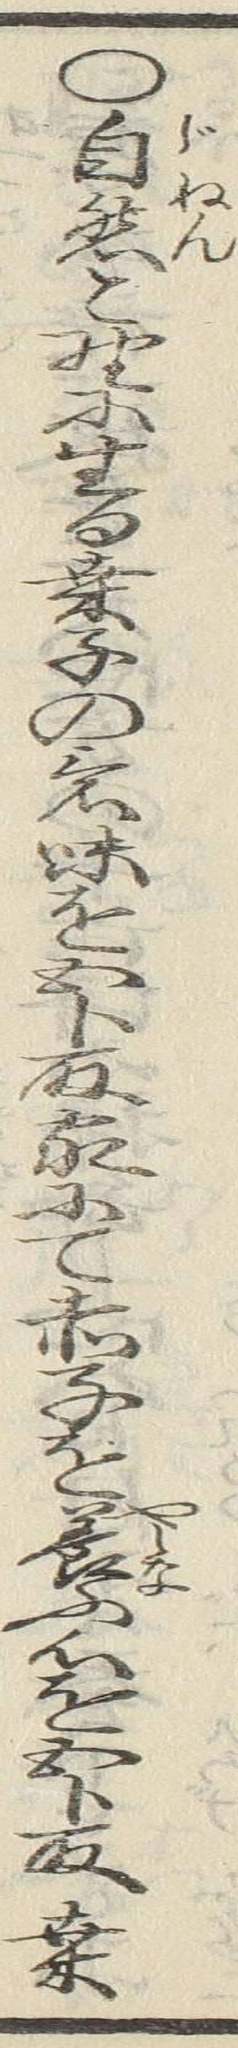○自然と野に生る桑子の意味を五分取家にて赤子を養ふ心を五分取桑
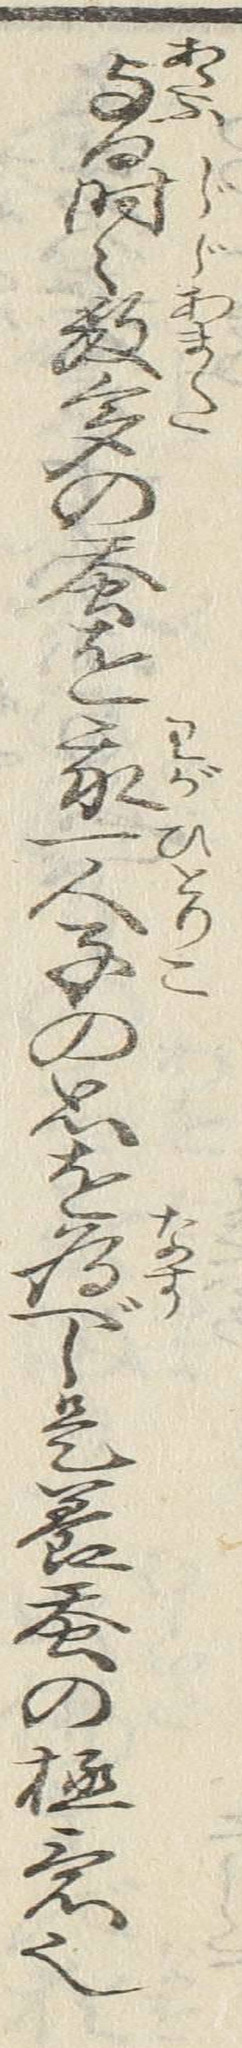与る時々数多の蚕を我一人子の思を為べし是養蚕の極意也
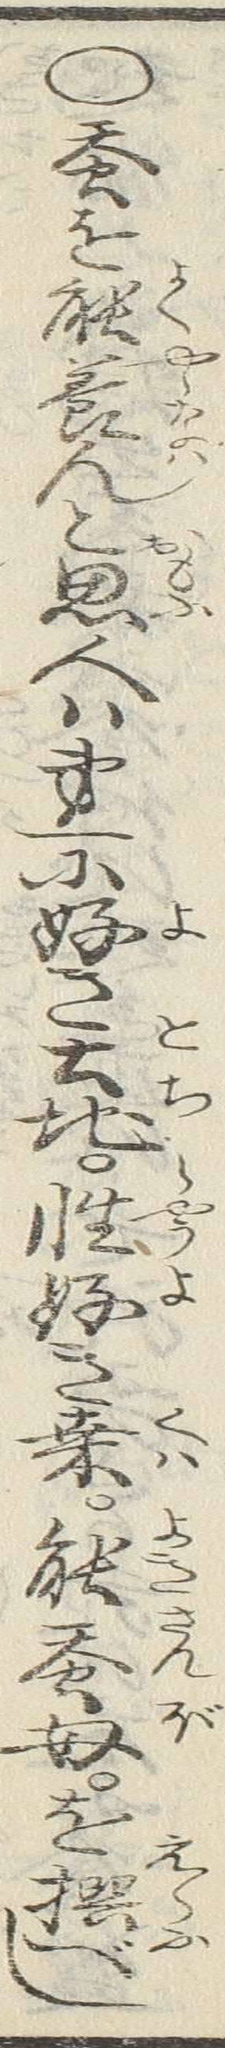○蚕を能養んと思人は第一に好き土地。性好き桑。能蚕母。を撰べし
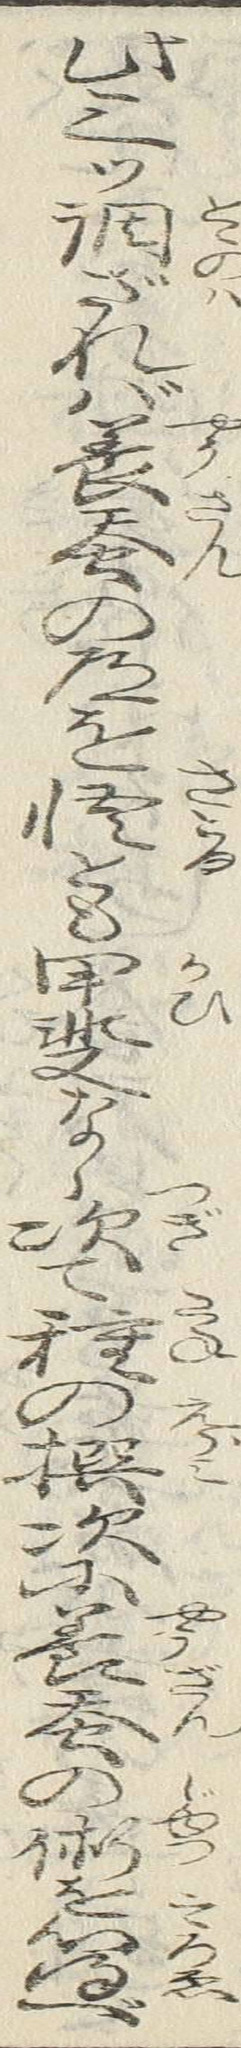此三ッ調ざれば養蚕の道を悟とも甲斐なし次て種の撰次に養蚕の術を心得べし
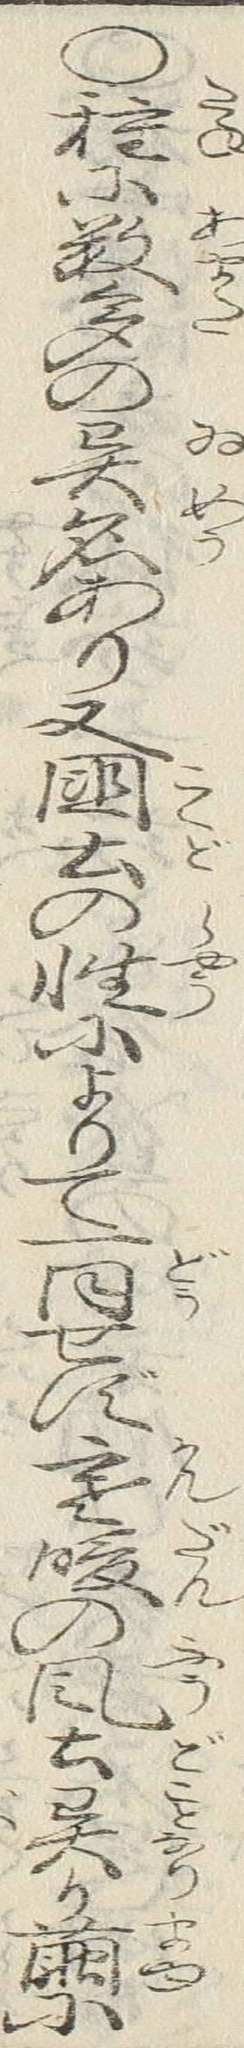○種に数多の異名あり又國土の性によりて一同せず寒暖の風土異り繭に
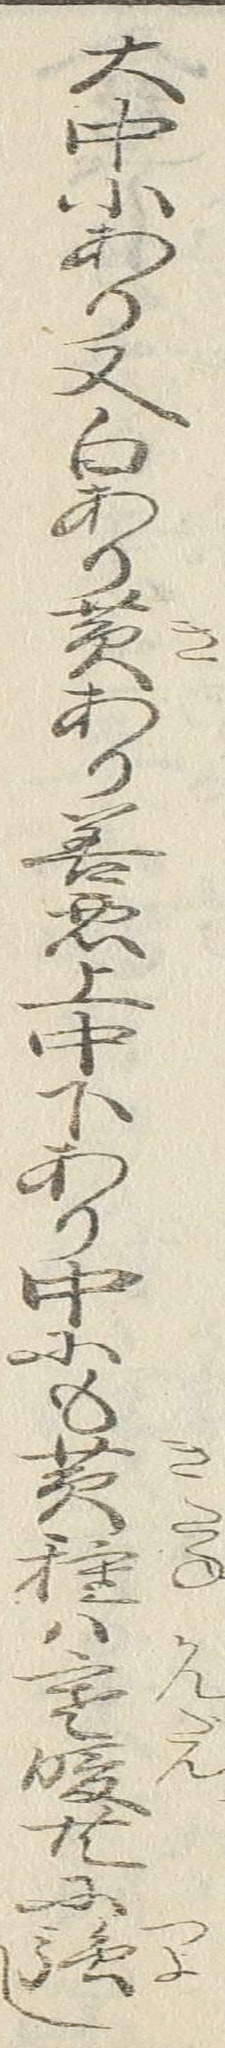大中小あり又白あり黄あり善悪上中下あり中にも黄種は寒暖共に強し
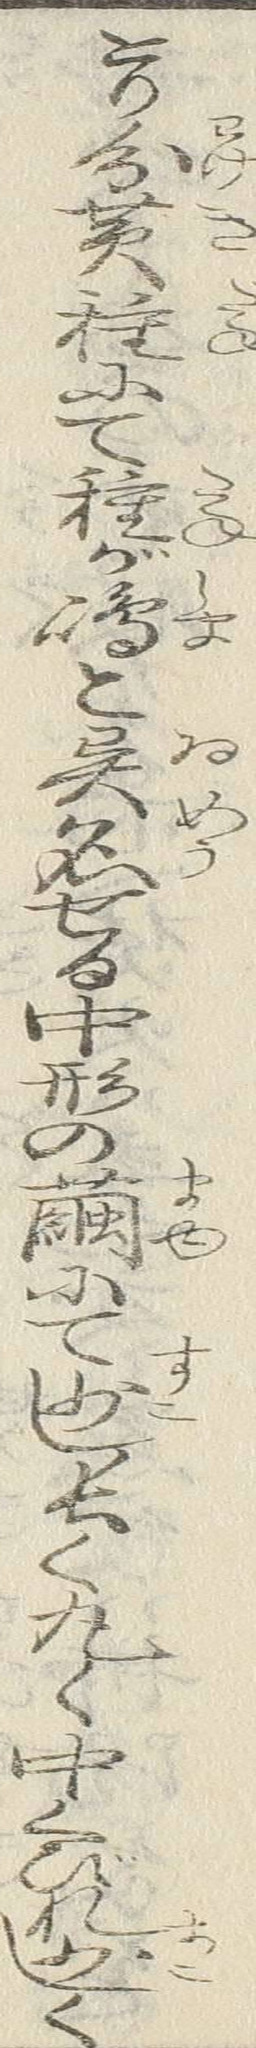とり分黄種にて種が嶋と異名せる中形の繭にて少し長く丸く中くびれ少しく
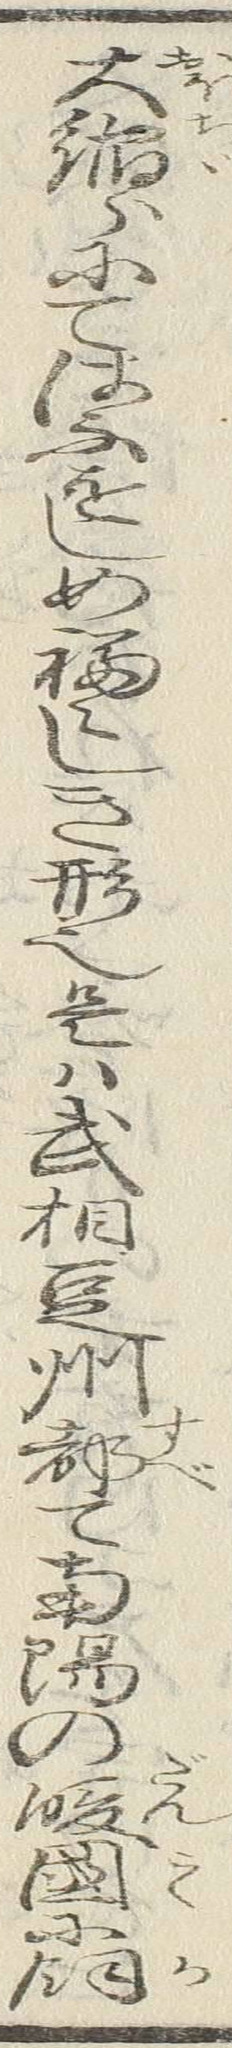大縮らにてはふをしめ福々しき形也是は武相豆州都て南陽の暖國に飼
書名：養蠶實驗録
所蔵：東京大学農学生命科学図書館 国文学研究資料館
